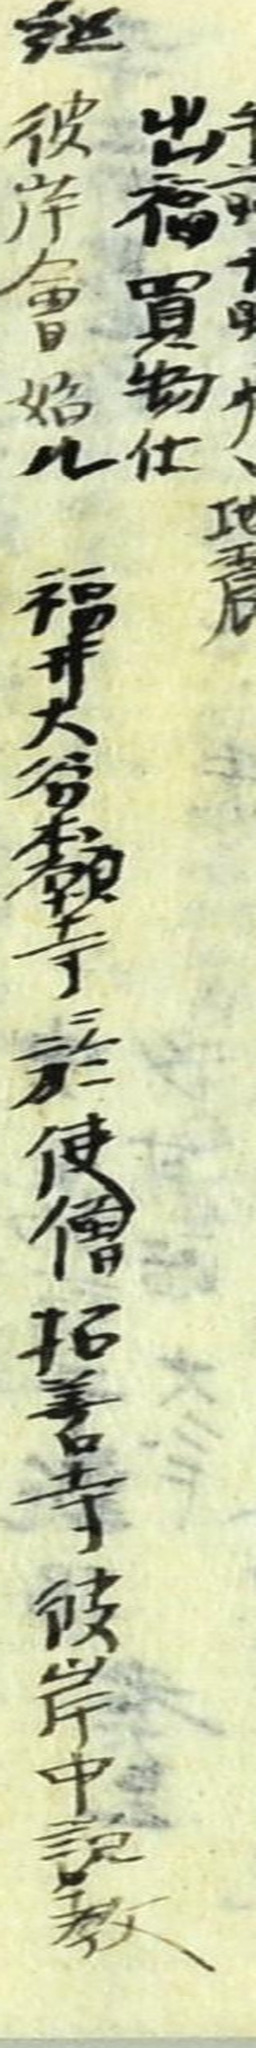彼岸会始ル福井大谷本願寺ニ於使僧招善寺彼岸中説教
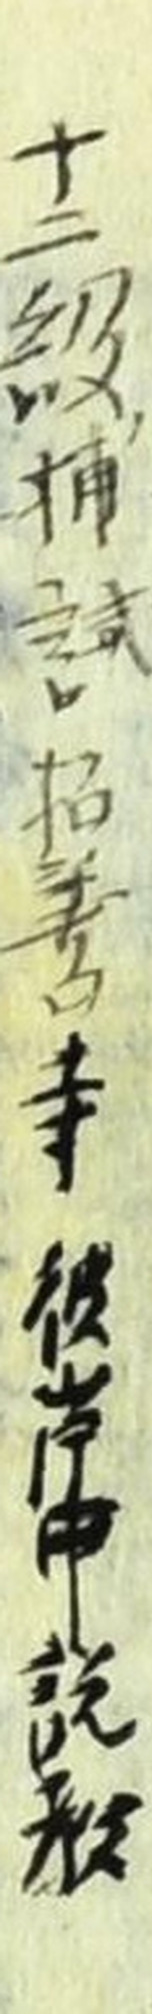十二級捕試招善寺彼岸中説教
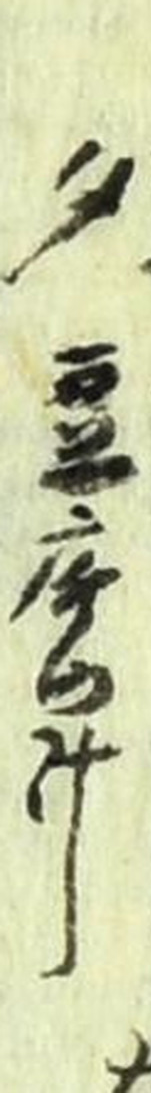夕豆腐汁
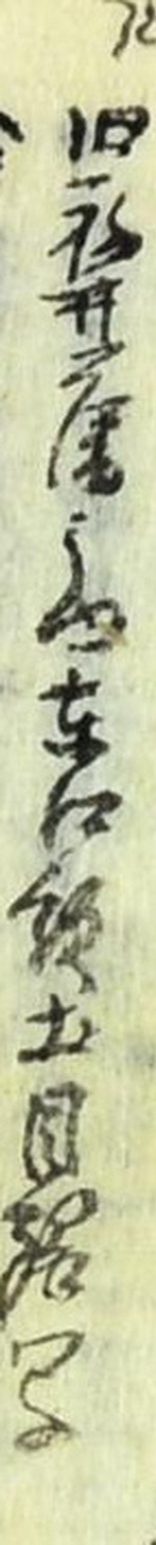旧福井藩之内東郷領土目録写
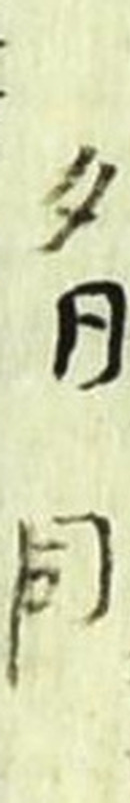夕同同
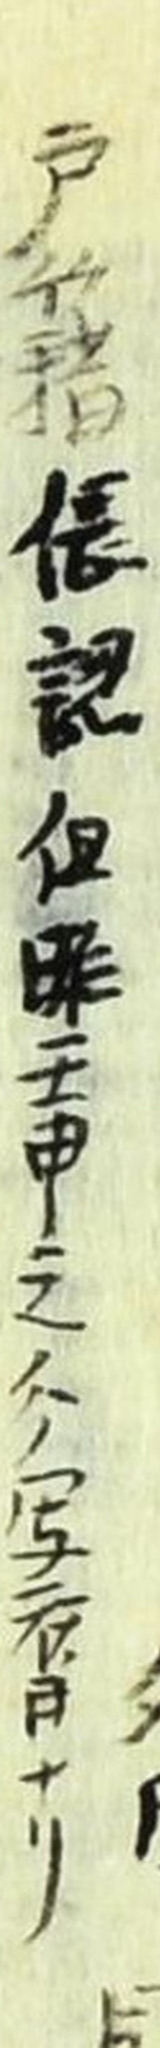戸籍帳認但昨壬申之分写替ナリ
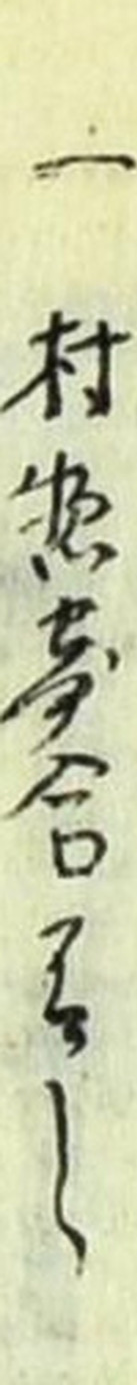一村惣寄合有之
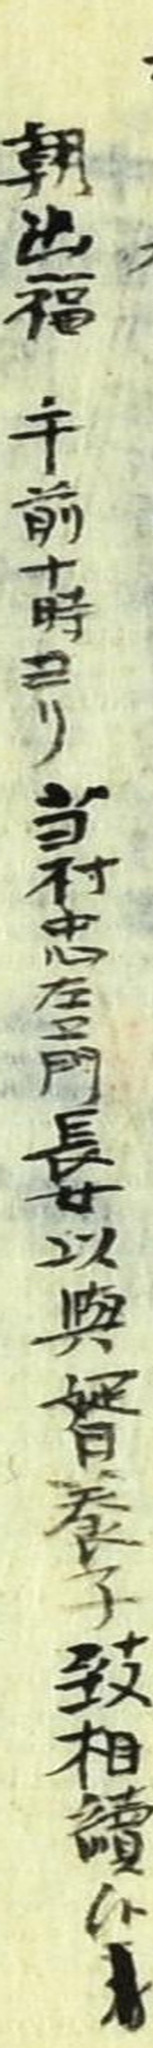朝出福午前十時ヨリ当村忠左ヱ門長女以与婿養子致相続候
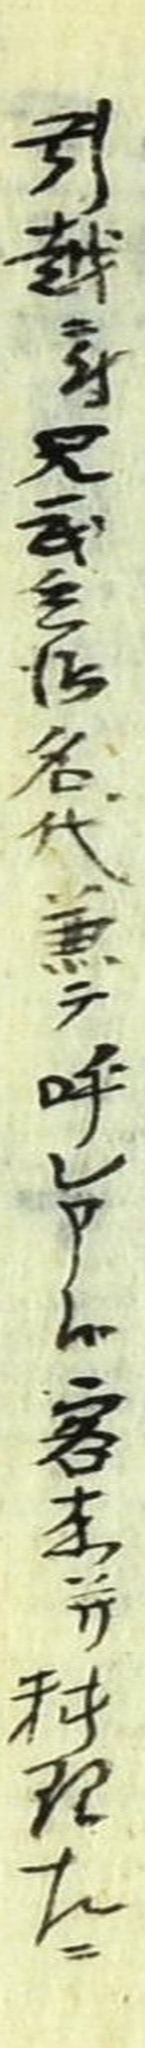引越ニ付兄武兵衛名代兼テ呼レ申候客来幷料理左ニ
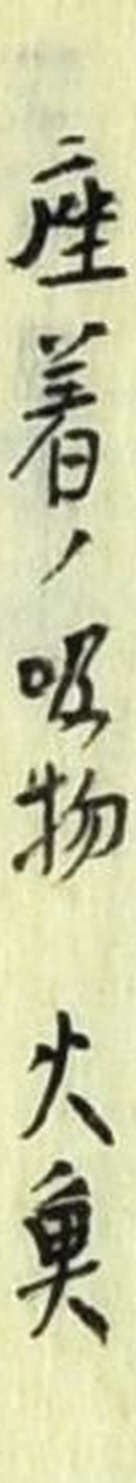座着ノ吸物火魚
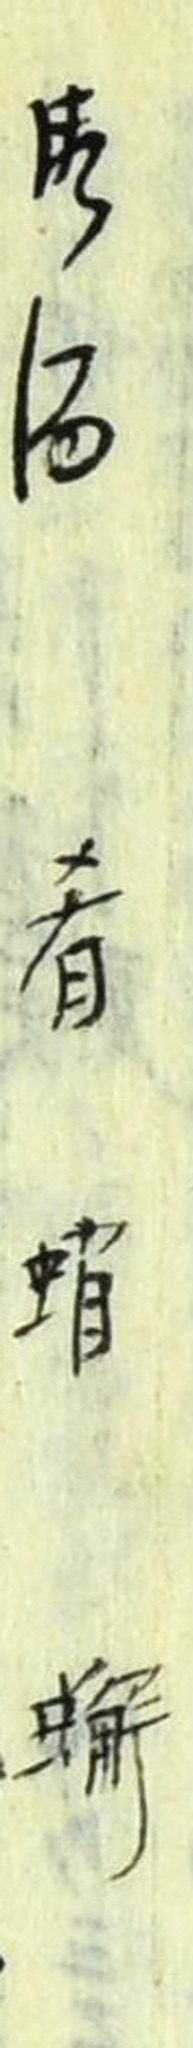御酒肴蛸蠏
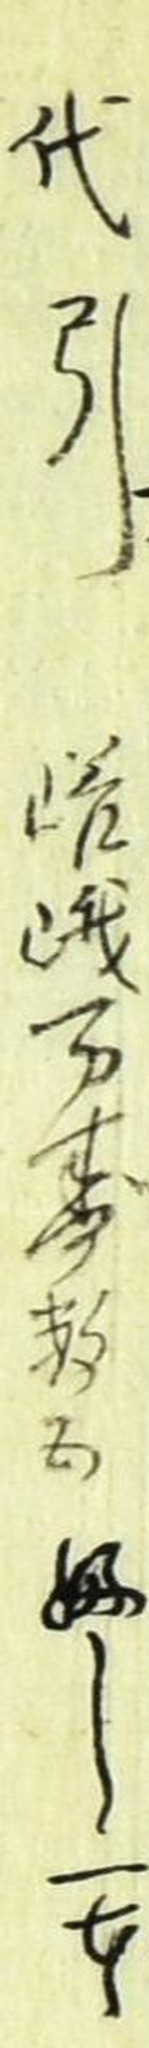代引嵯峨万寿数五ふし一本
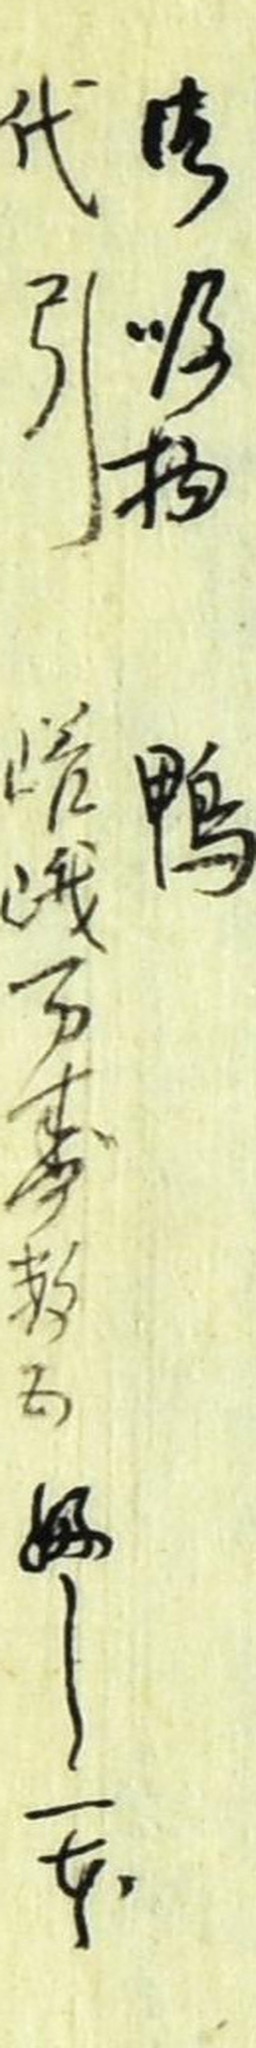代引嵯峨万寿数五ふし一本

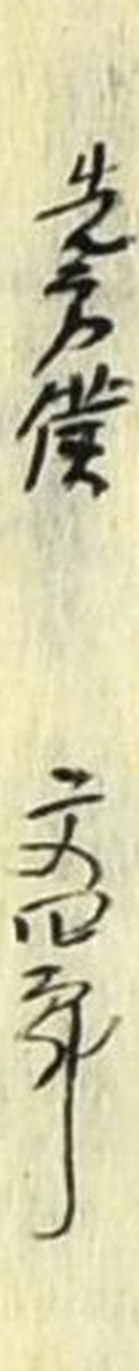先方僕文四郎
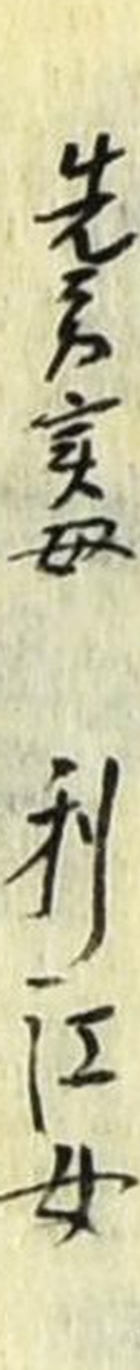先方実母利江女
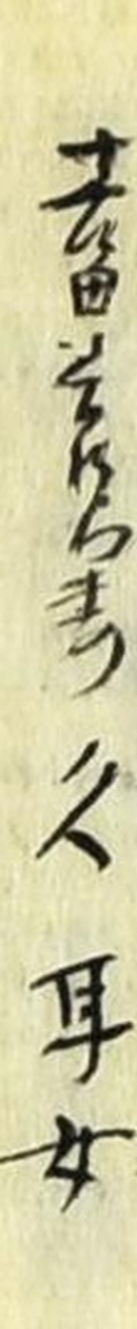吉田善左衛門妻久耳女
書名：（日記）
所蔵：福井県文書館 Fukui Prefectural Archives
